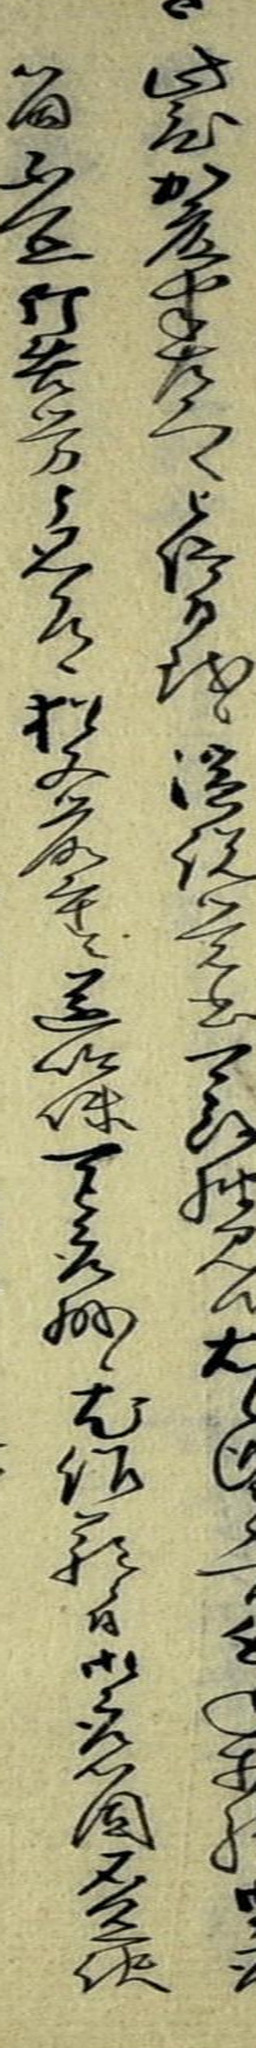箇不宜御苦労被思召候猶又厳重に遂吟味可被取扱候尤作難に付御取箇不宜訳
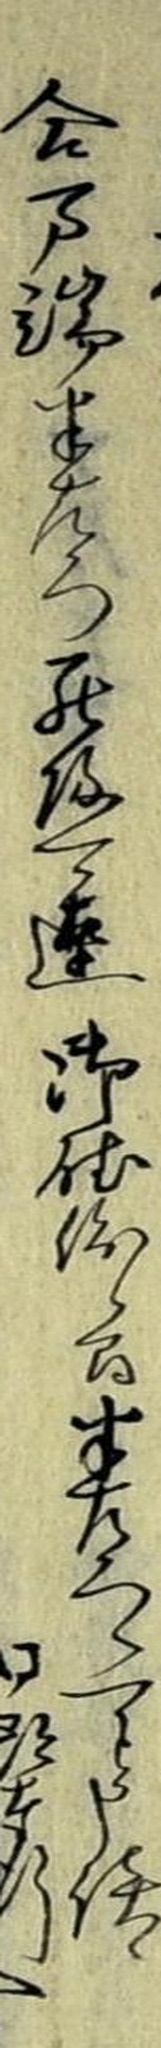合万端半左衛門罷帰可達御聴儀候間半左衛門へ可被申談候
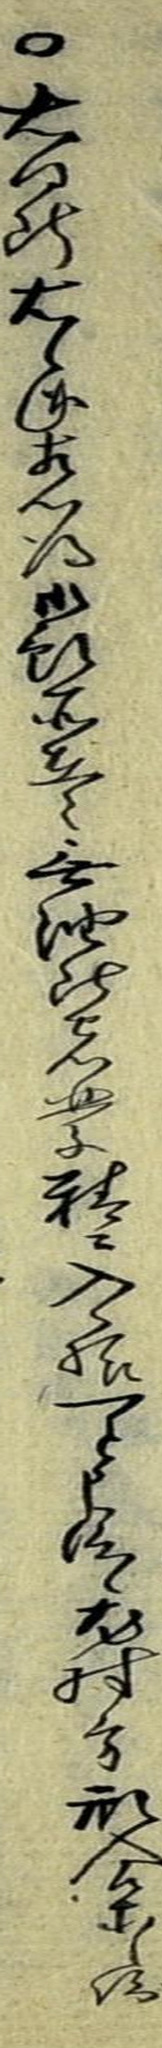〇右同断右之趣相心得御預所在々無油断農業精に入候様可被申渡候尤村方形合等之儀
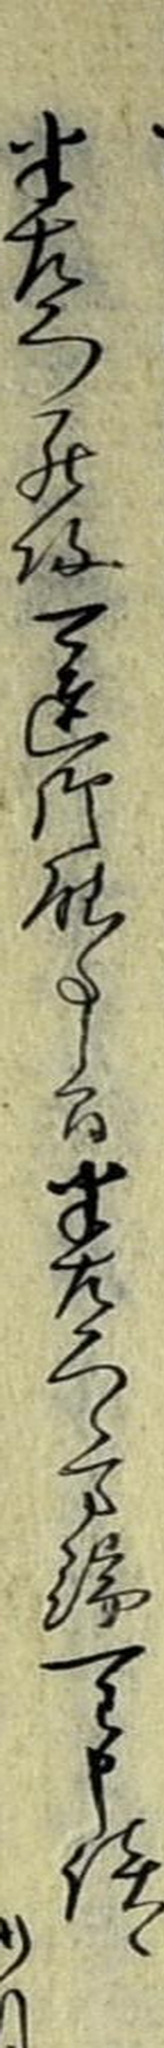半左衛門罷帰可達御聴事候間半左衛門へ万端可被申談候
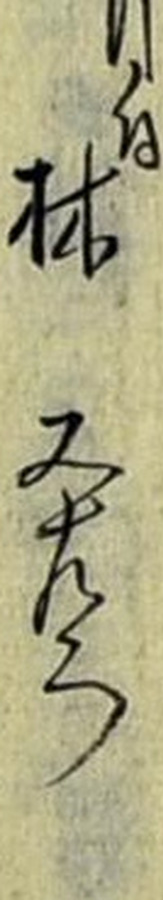林又左衛門
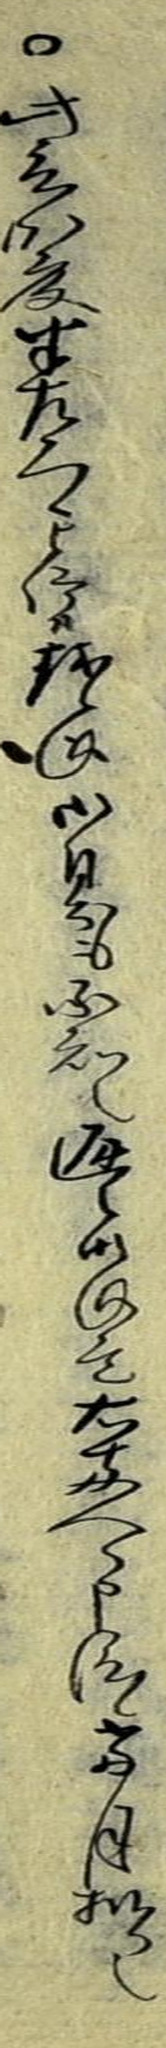〇此度加藤半左衛門へ被仰付越候趣御自分も承知之通之御趣意右両人へ申渡候当月掛り之
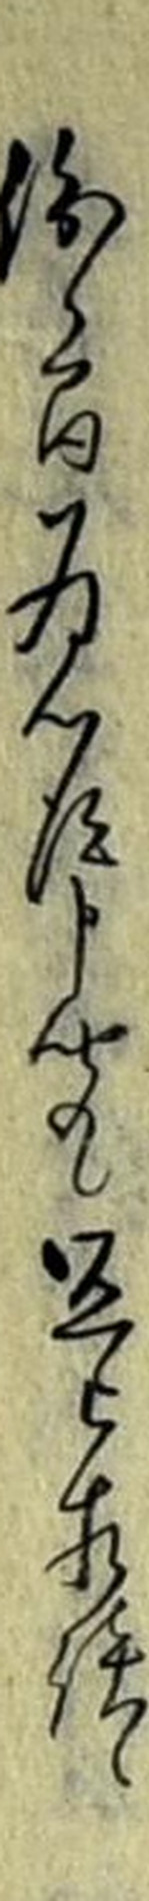儀候間為心得申聞候宜被相談候

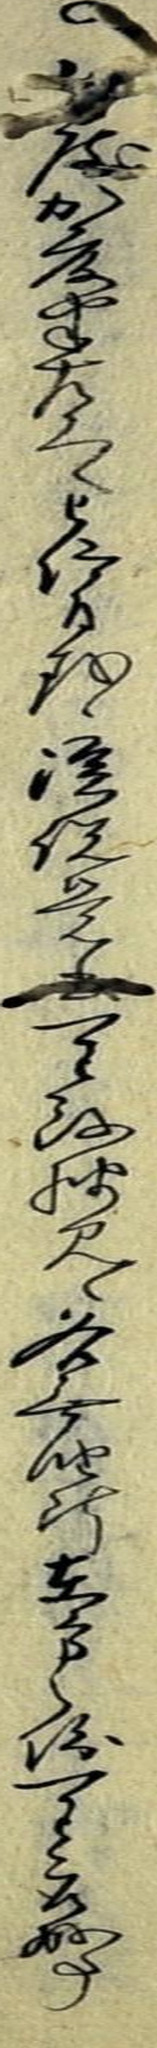〇此度加藤半左衛門へ被仰付越候演説覚書可被致披見候各無油断在方之儀可被取扱事
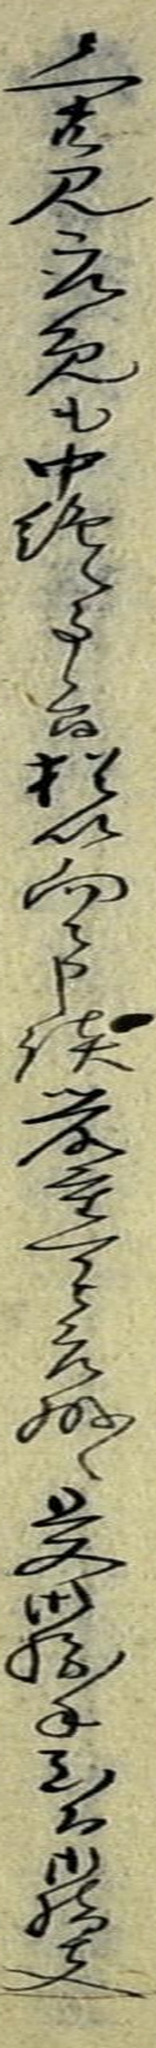候へ共見取免も中絶之事候間猶以向々申談厳重可被取扱候且又御勝手至而御指支
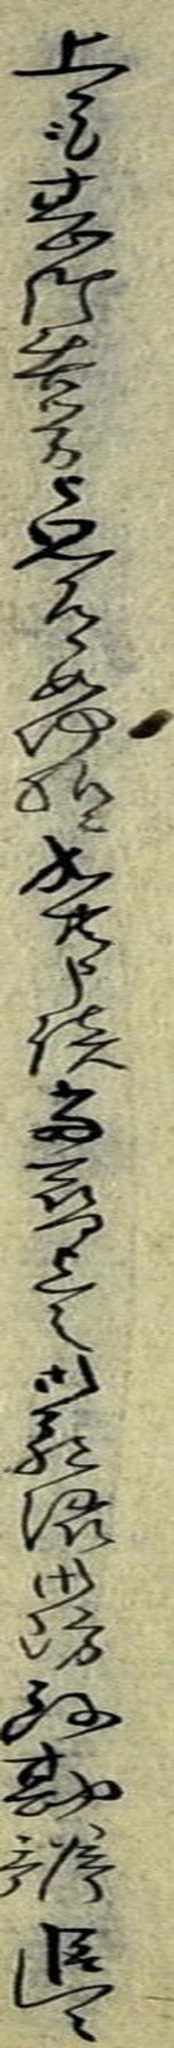上にも甚御苦労被思召如何様に成共申談当暮迄之御難渋御防致勘弁追々
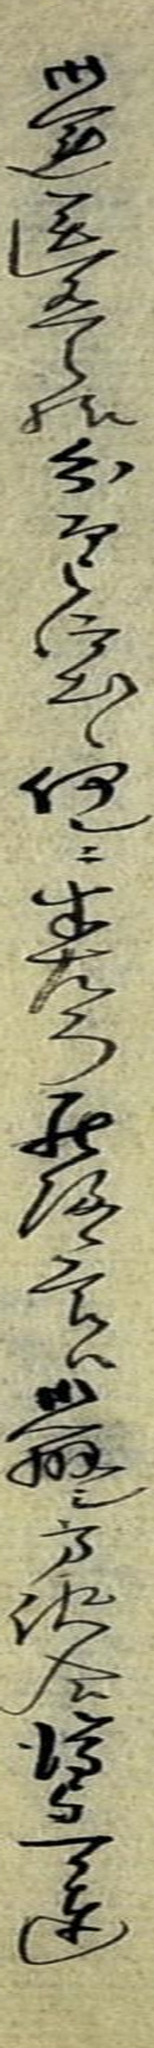御運送有之様分而被仰出候何れに半左衛門罷帰候節は御弁し方訳合得与可達
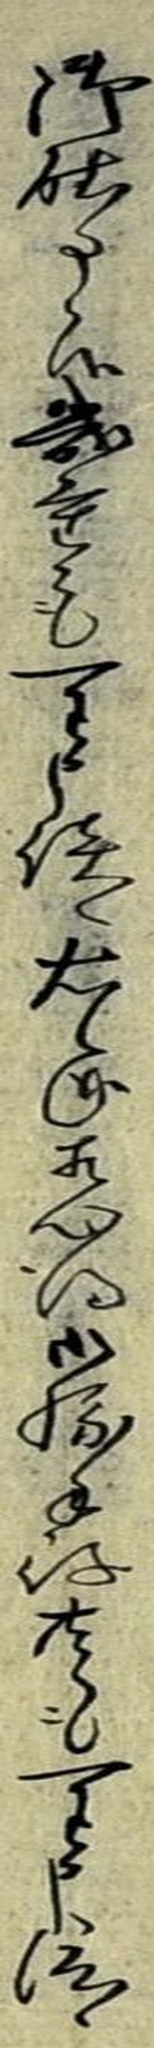御聴事に候幾重にも可被申談候右之趣相心得御勝手役共へも可被申渡候
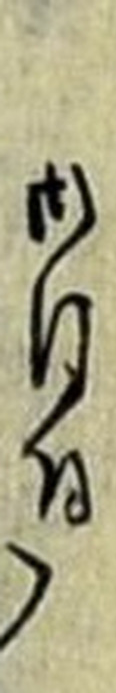御目付
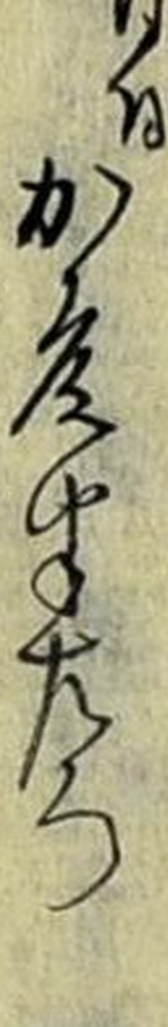加藤半左衛門
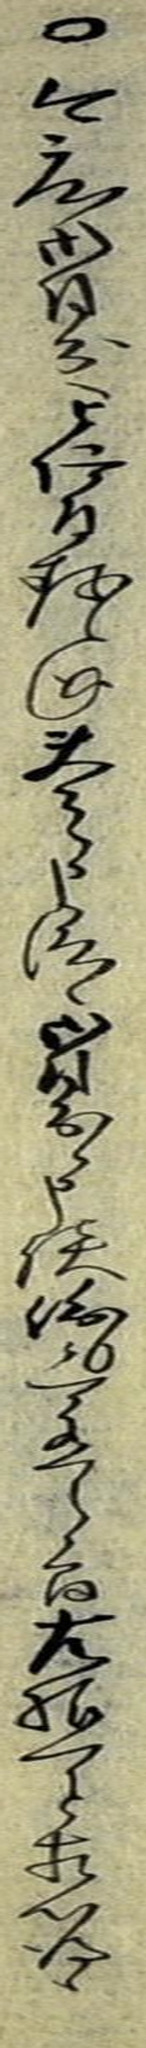〇今度御自分へ被仰付越候趣夫々へ申渡候御自分へ申談儀も可有之候間左様可被相心得候
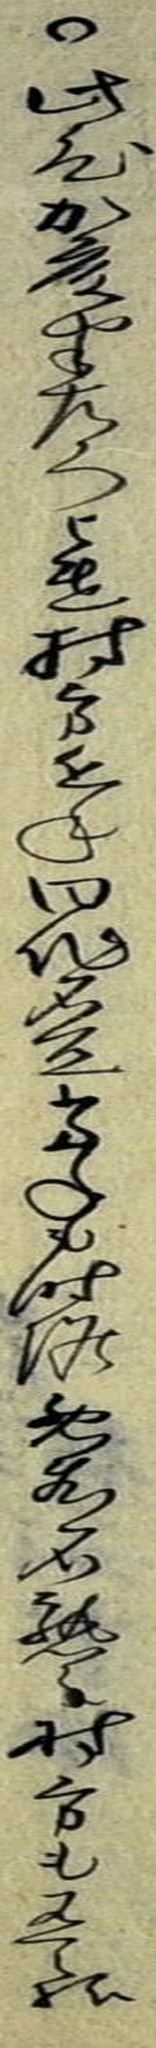〇此度加藤半左衛門被遣村方近年田作不宜当年も時候悪敷不熟之村方も有之様
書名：命令之部 二
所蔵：福井県文書館 Fukui Prefectural Archives
